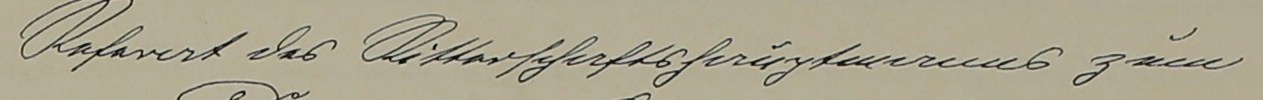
Referat des Ritterschaftshauptmanns zum
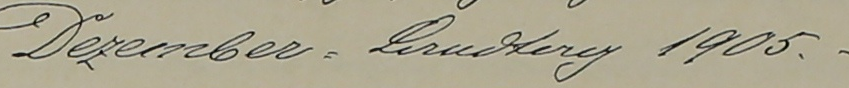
Dezember-Landtag 1905.
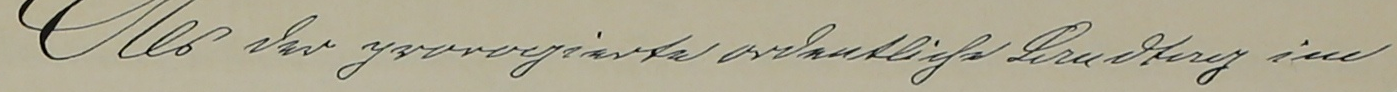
Als der prorogierte ordentliche Landtag im
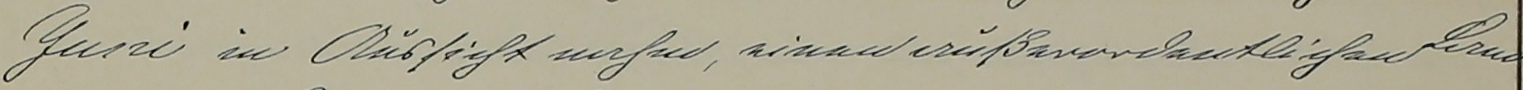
Juni in Aussicht nahm, einen außerordentlichen Land-
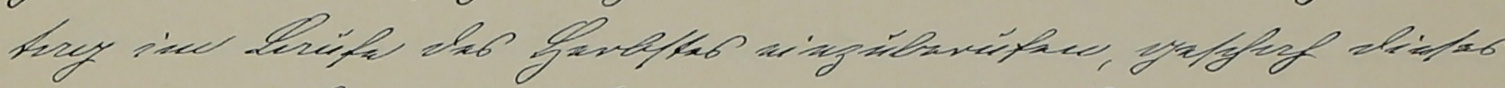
tag im Laufe des Herbstes einzuberufen, geschah dieses
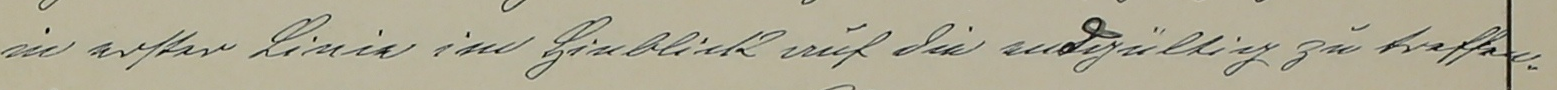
in erster Linie im Hinblick auf die endgültig zu treffen-
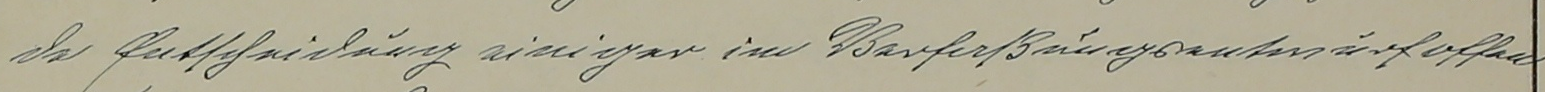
de Entscheidung einiger im Verfaßungsentwurf offen
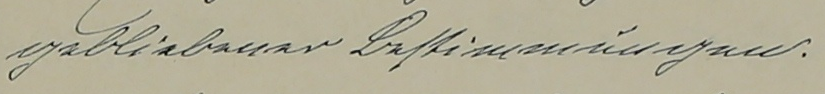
gebliebener Bestimmungen.
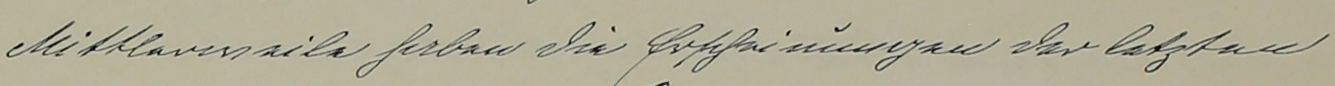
Mittlerweile haben die Erscheinungen der letzten
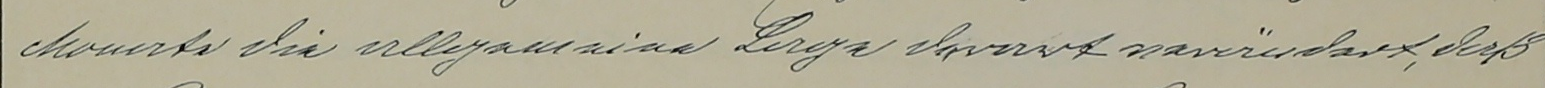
Monate die allgemeine Lage derart verändert, daß
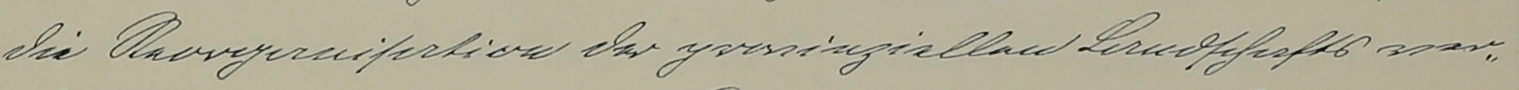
die Reorganisation der provinziellen Landschaftsver-
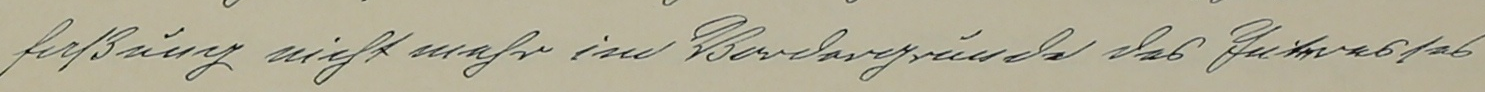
faßung nicht mehr im Vordergrunde des Interesses
